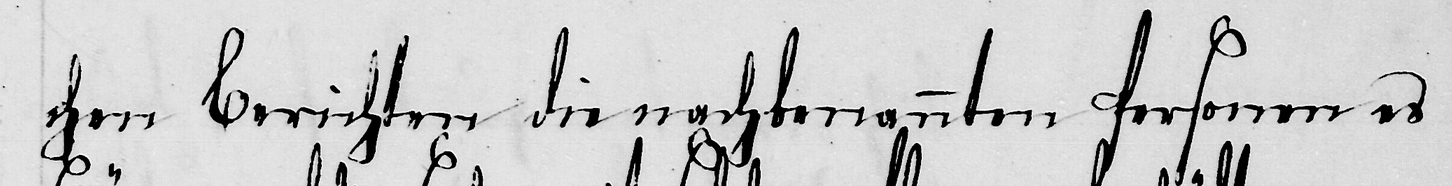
chen Berichten die nachbenannten Personen es
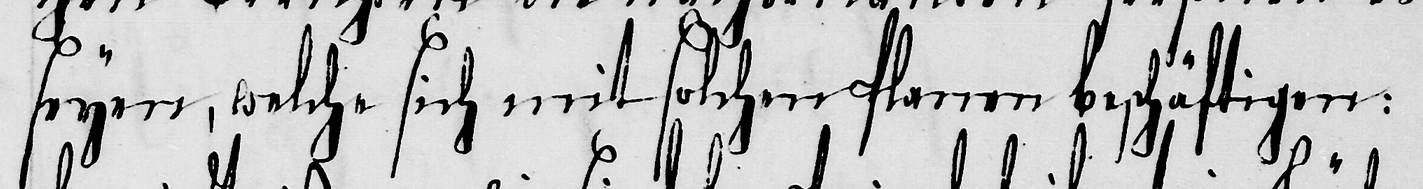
seyen, welche sich mit solchen Planen beschäftigen:
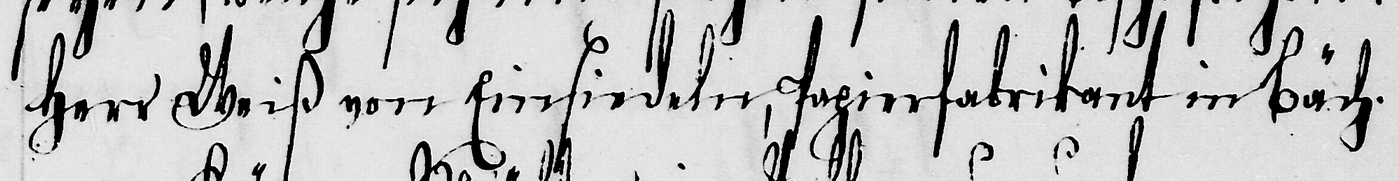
Herr Weiß von Einsiedeln, Papierfabrikant in Bäch.
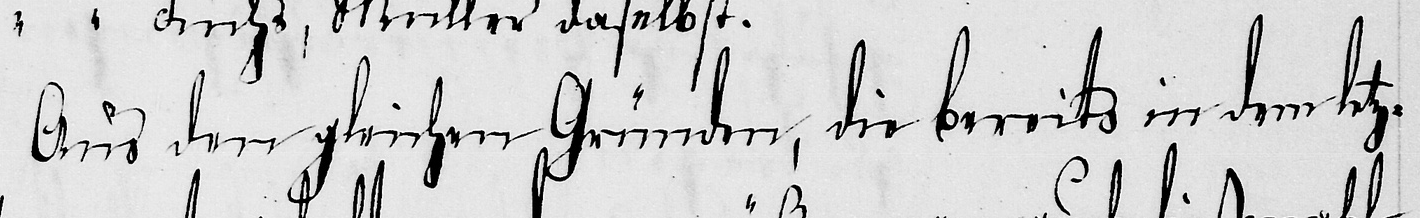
Aus den gleichen Gründen, die bereits in dem let¬
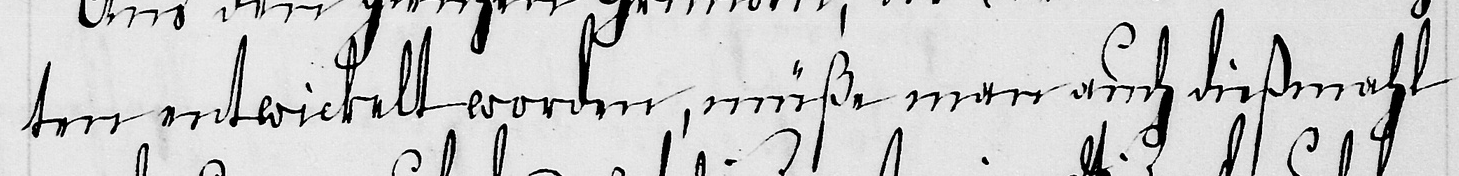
zten entwickelt worden, müße man auch dießmahl
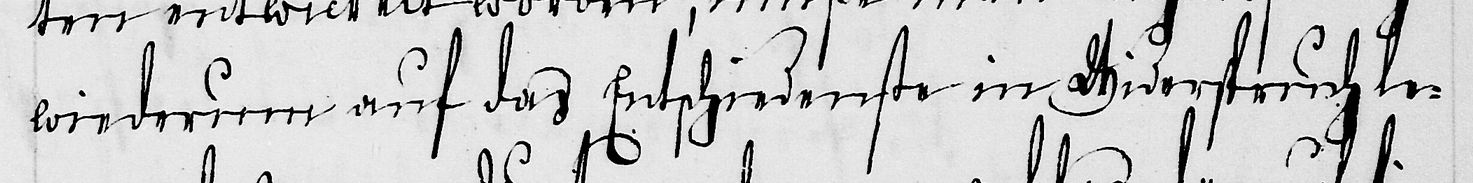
wiederum auf das Entschiedenste in Widerspruch le¬
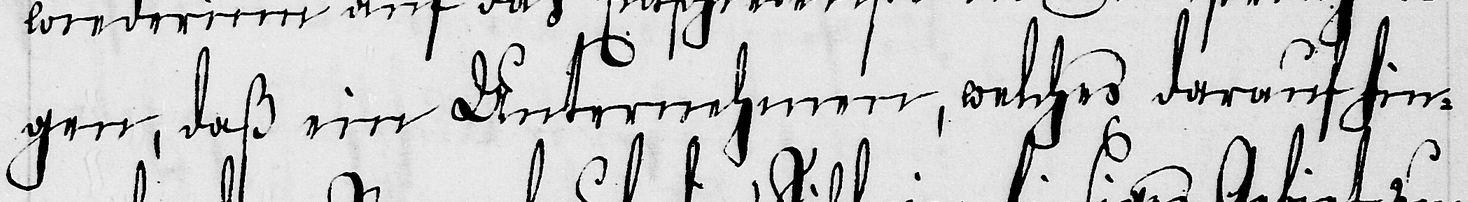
gen, daß ein Unternehmen, welches darauf hin¬
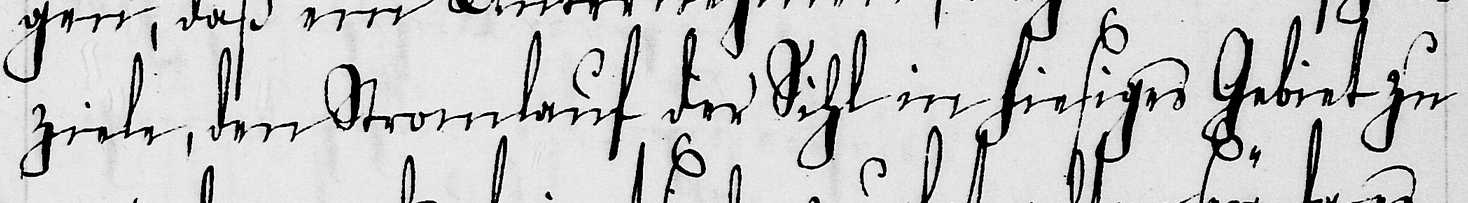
ziele, den Stromlauf der Sihl in hiesiges Gebiet zu
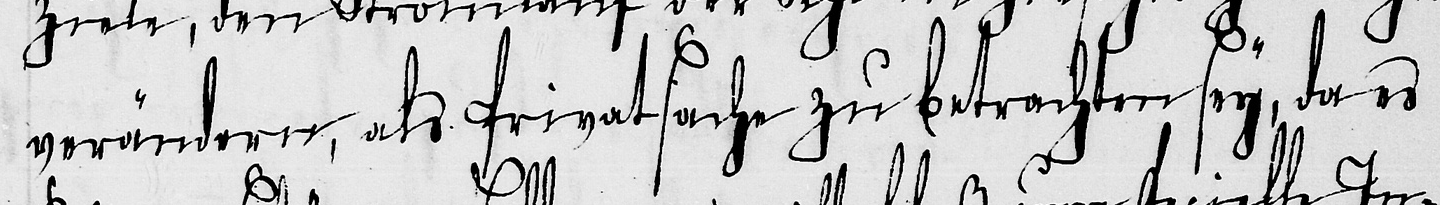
verändern, als Privatsache zu betrachten sey, da es
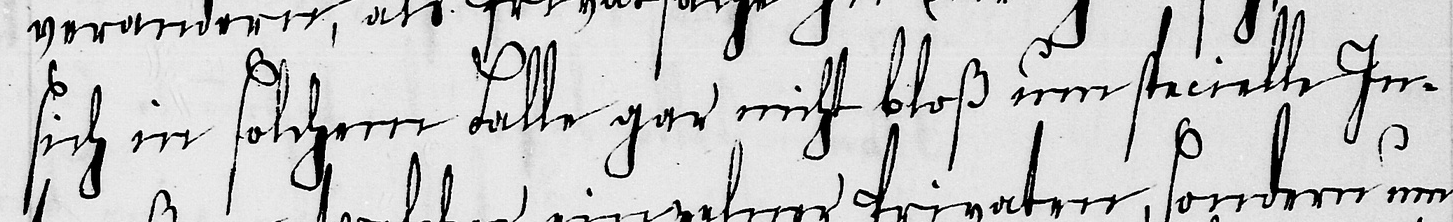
sich in solchem Falle gar nicht bloß um specielle In¬
